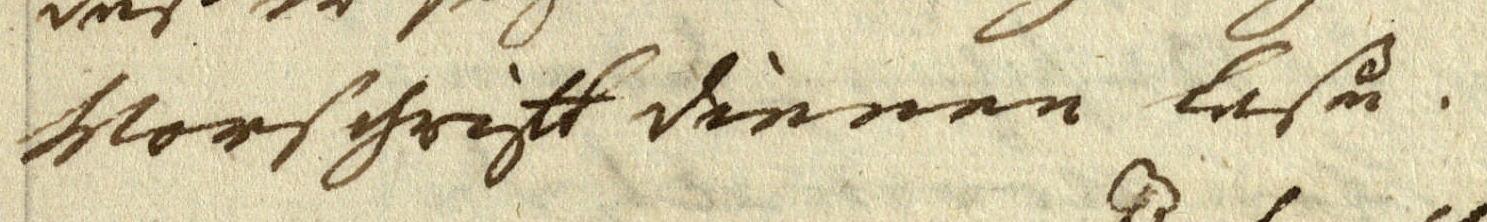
Vorschrift dienen laße.
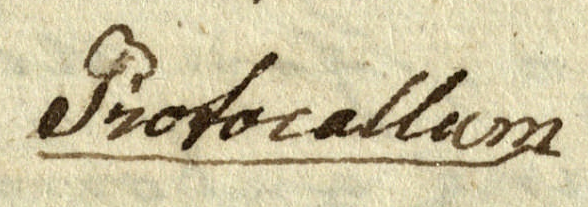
Protocollum
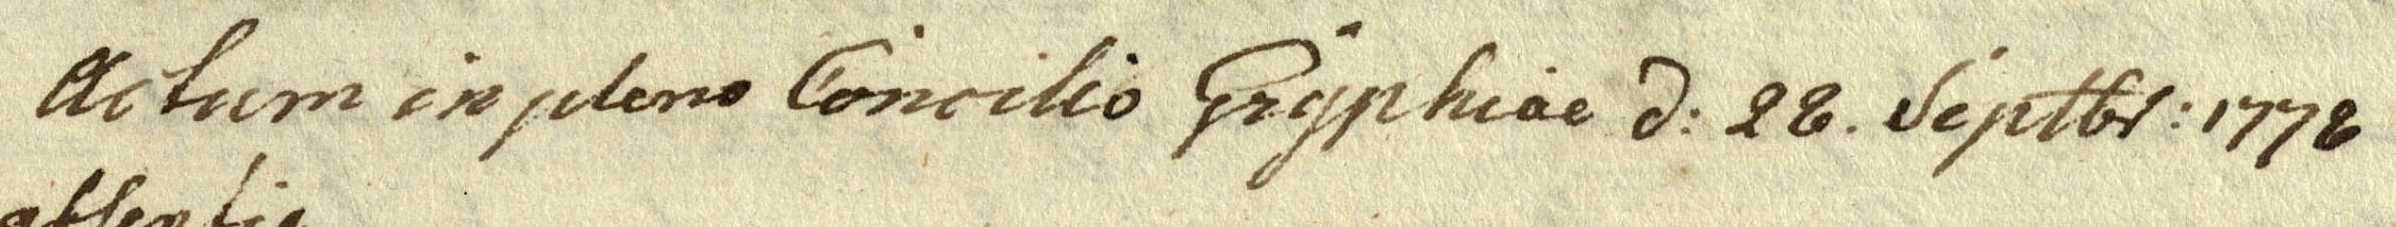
Actum in pleno Concilio Grÿphiae d. 28. Septbr. 1778
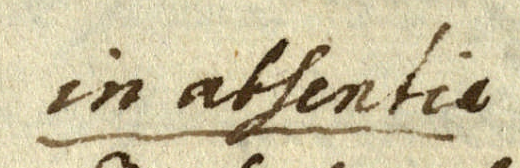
in absentia
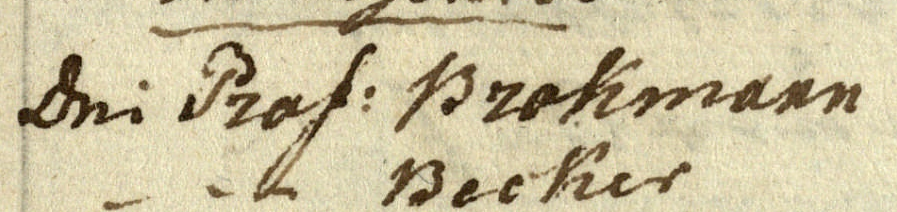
Dni. Prof. Brokmann
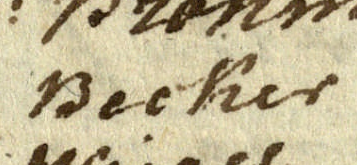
Becker
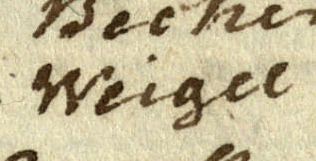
Weigel
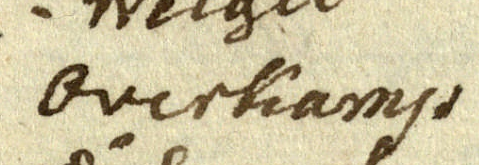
Overkamp
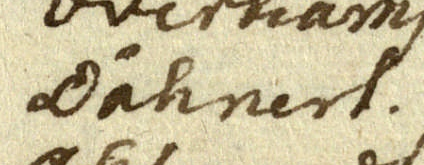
Dähnert.
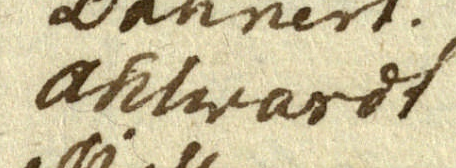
Ahlwardt
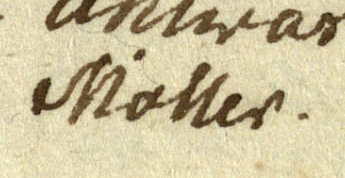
Möller.
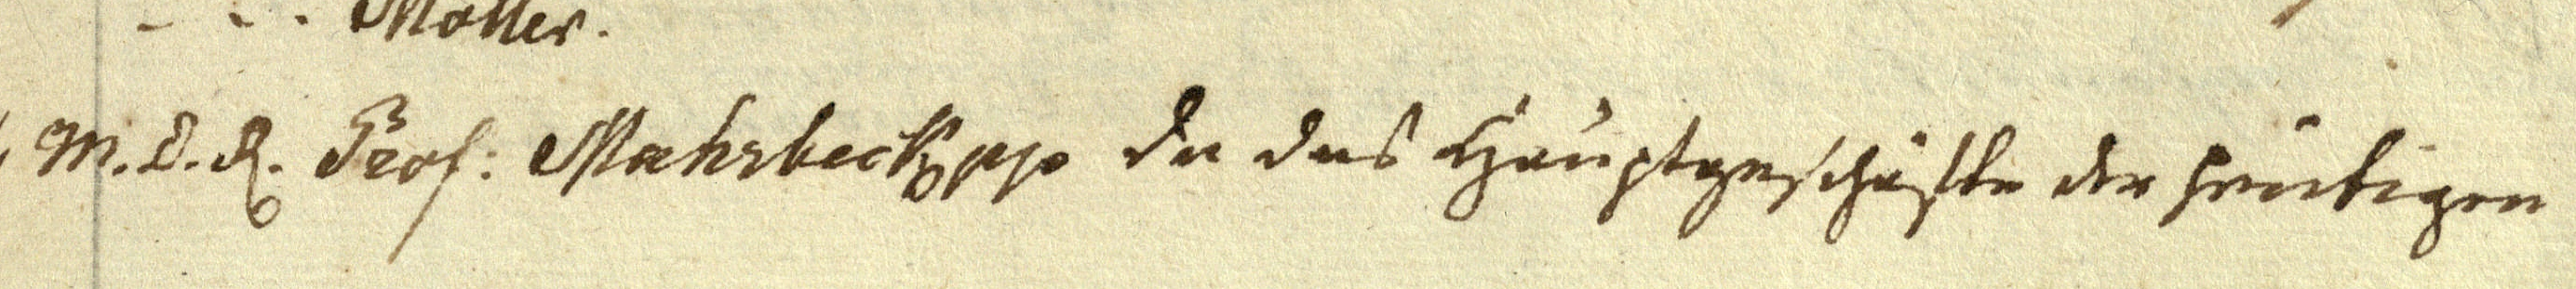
1, M. D. R. Prof. Muhrbeck pp Da das Hauptgeschäfte der heutigen
